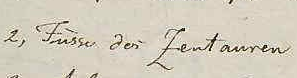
2, Füsse des Zentauren
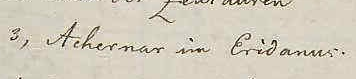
3, Achernar im Eridanus.
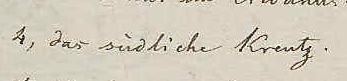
4, das südliche Kreutz.
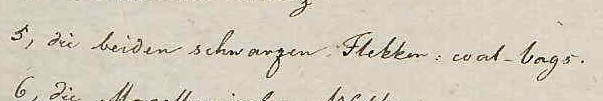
5, die beiden schwarzen Flekken: coal-bags.
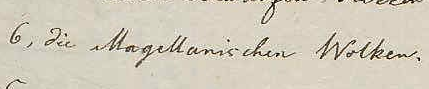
6, die Magellanischen Wolken.
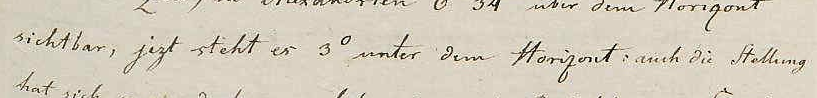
sichtbar, jezt steht es 3° unter dem Horizont: auch die Stellung
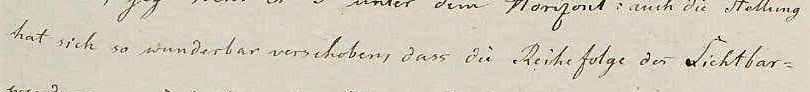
hat sich so wunderbar verschoben, dass die Reihefolge des Sichtbar-
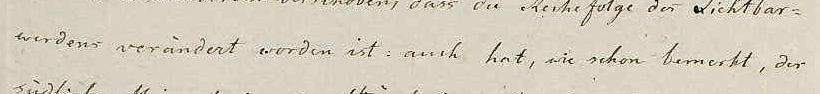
werdens verändert worden ist: auch hat, wie schon bemerkt, der
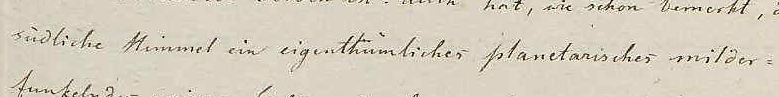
südliche Himmel ein eigenthümliches planetarisches milder-
